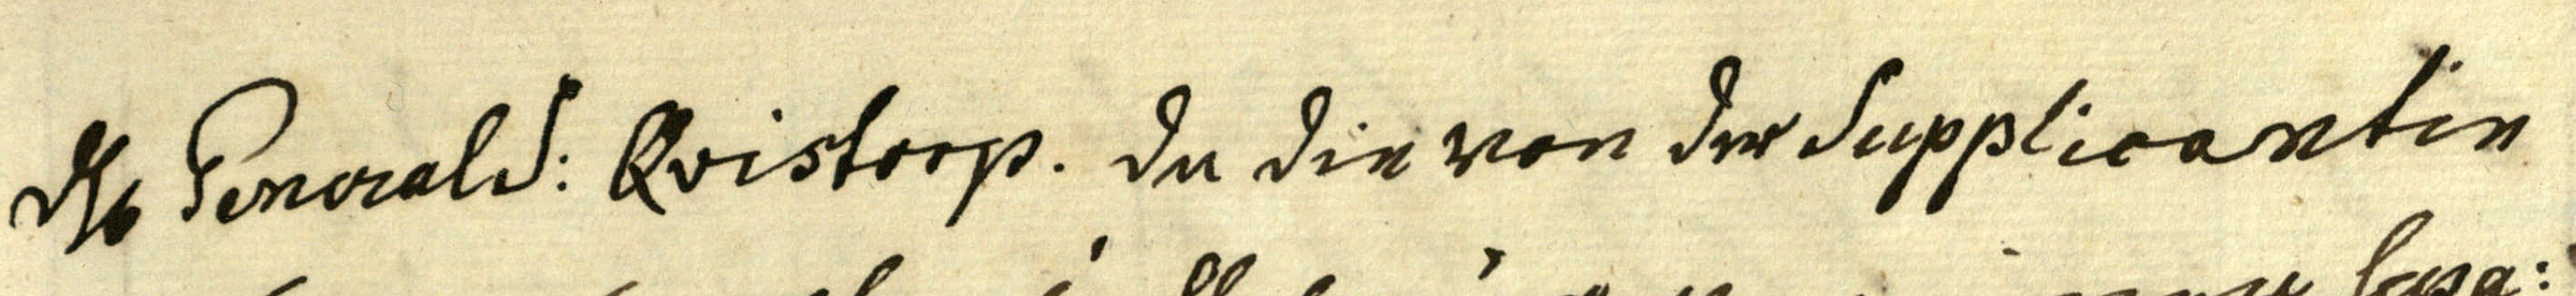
dh. GeneralS. Quistorp. Da die von der Supplicantin
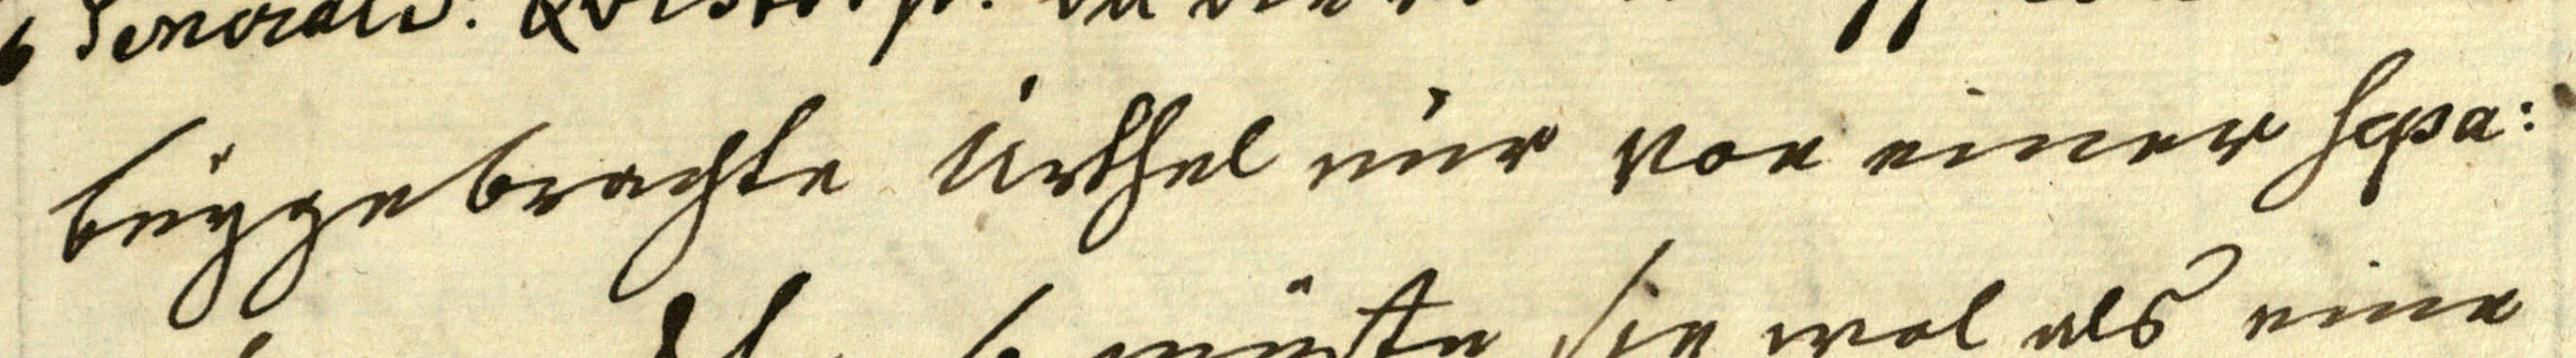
beÿgebrachte Urthel nur von einer sepa¬
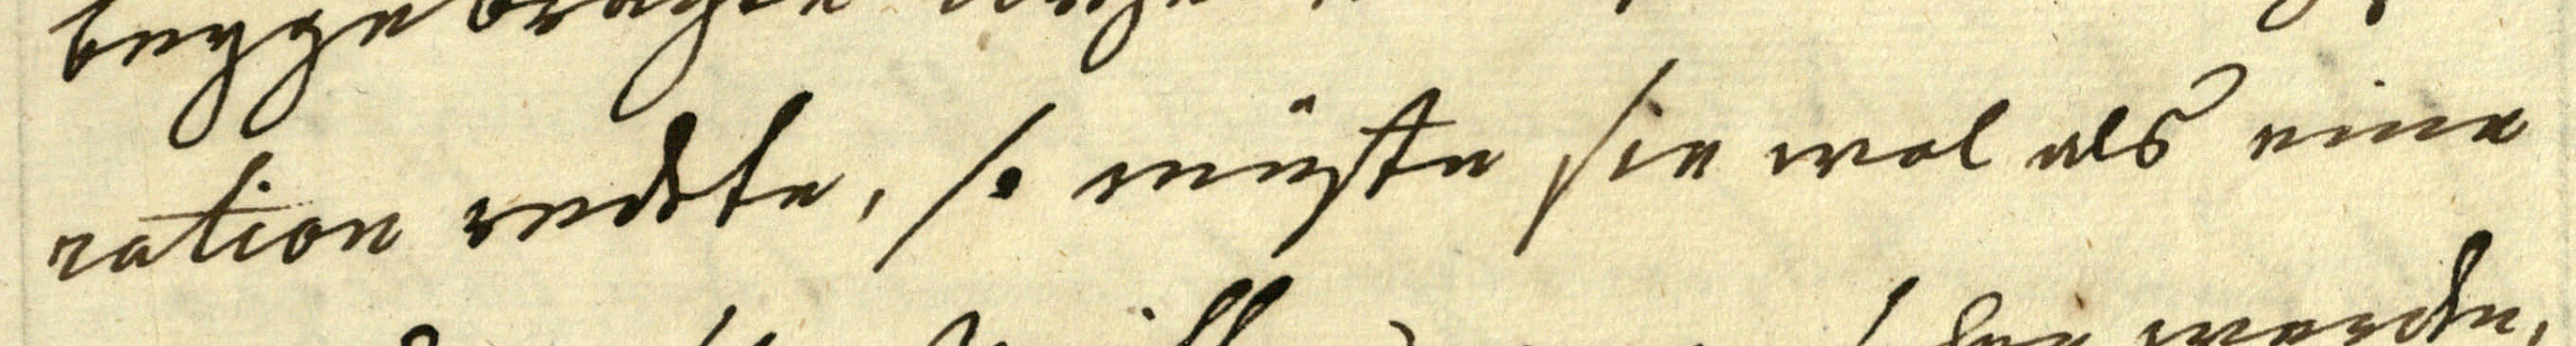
ration redete, so müste sie wol als eine
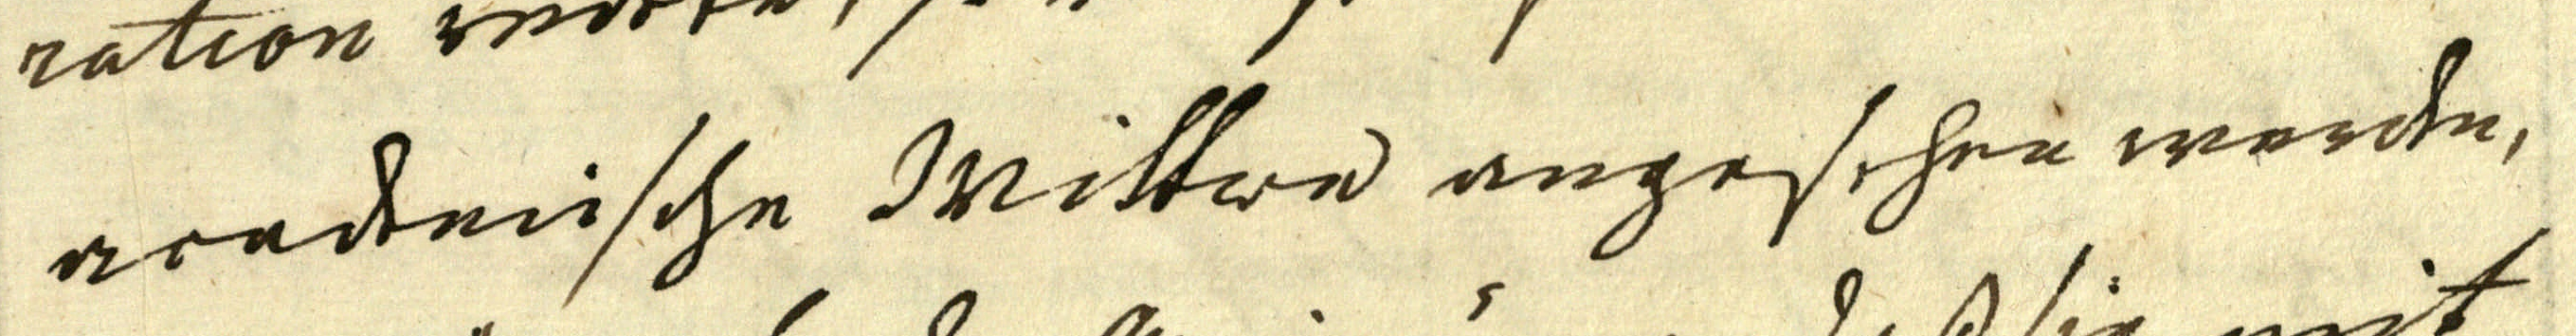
academische Wittwe angesehen werden,
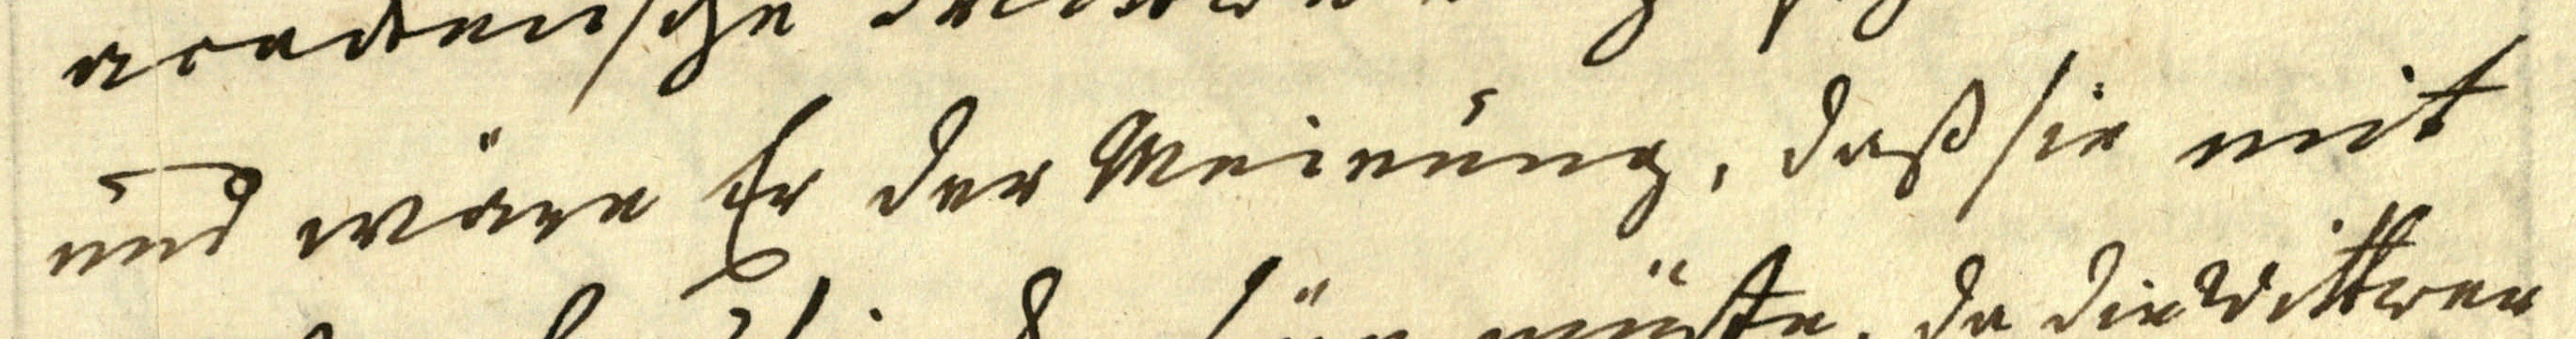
und wäre Er der Meinung, daß sie mit
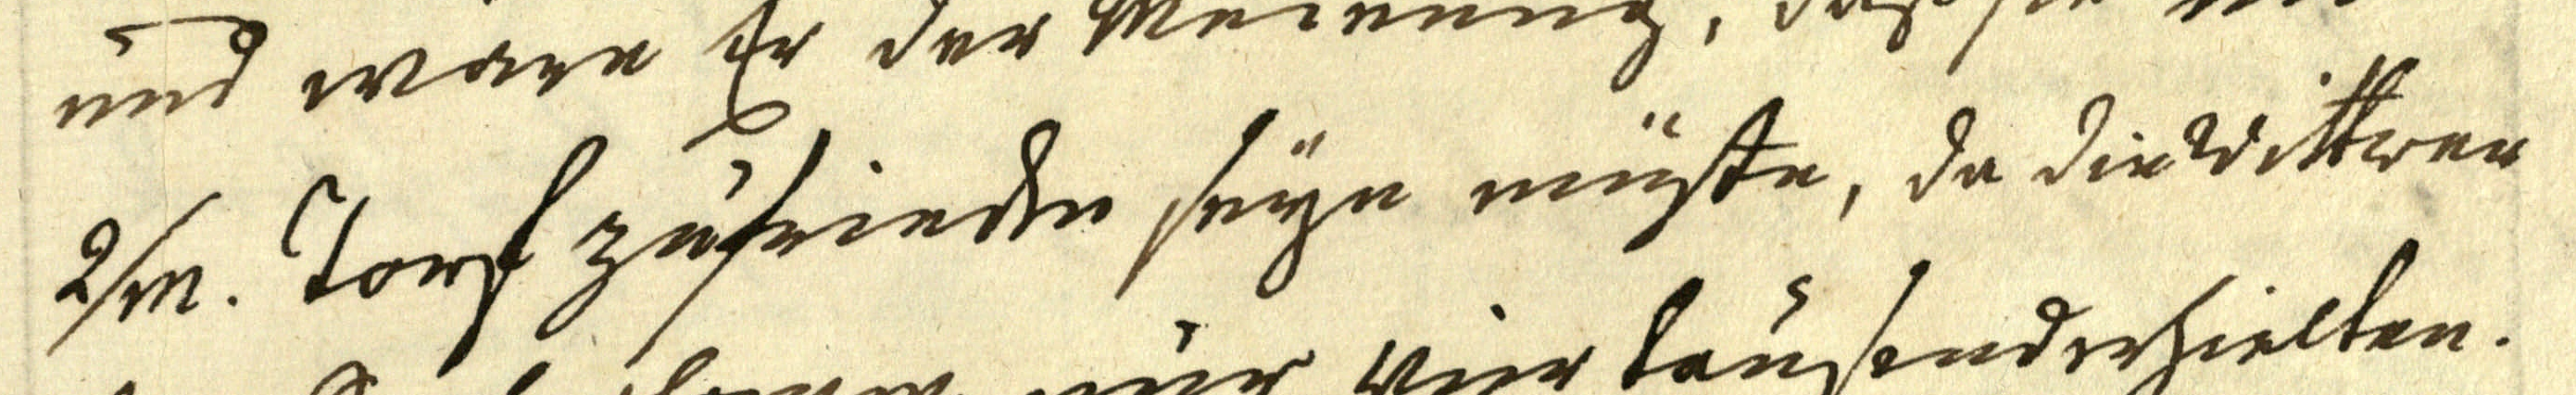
2/m Torf zufrieden seÿn müste, da die Wittwen
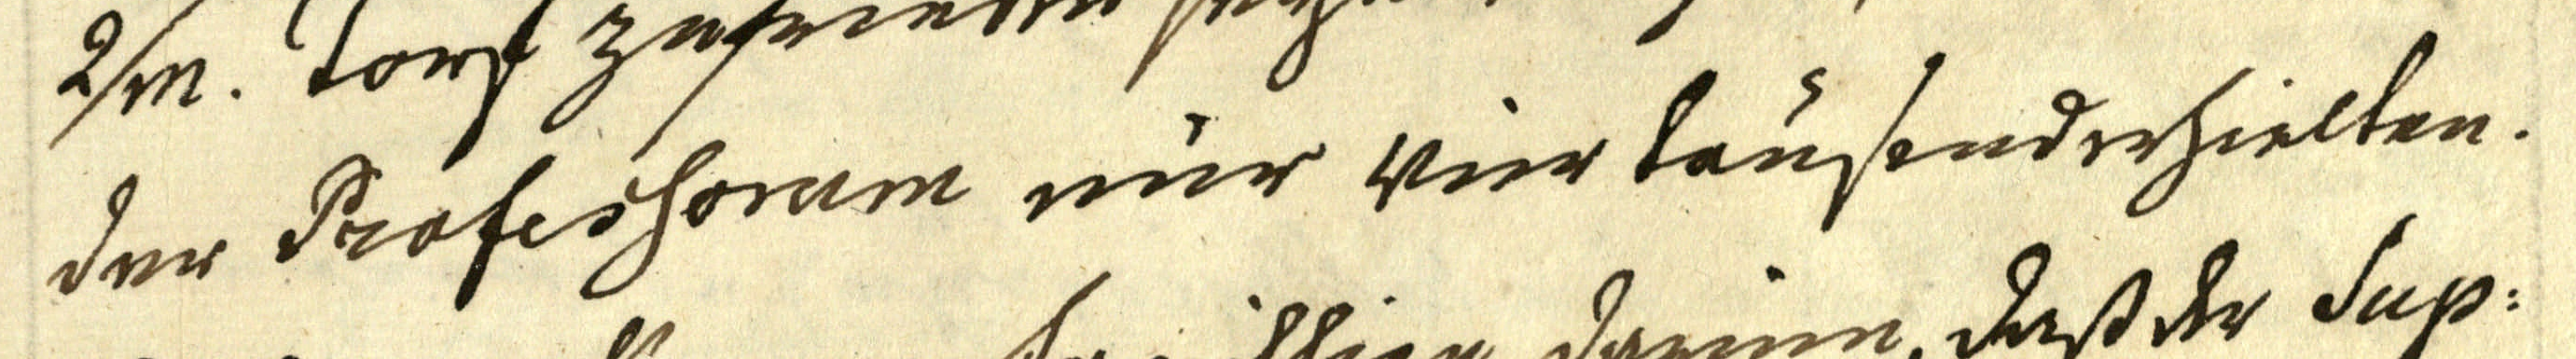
der Professorum nur vier tausend erhielten.
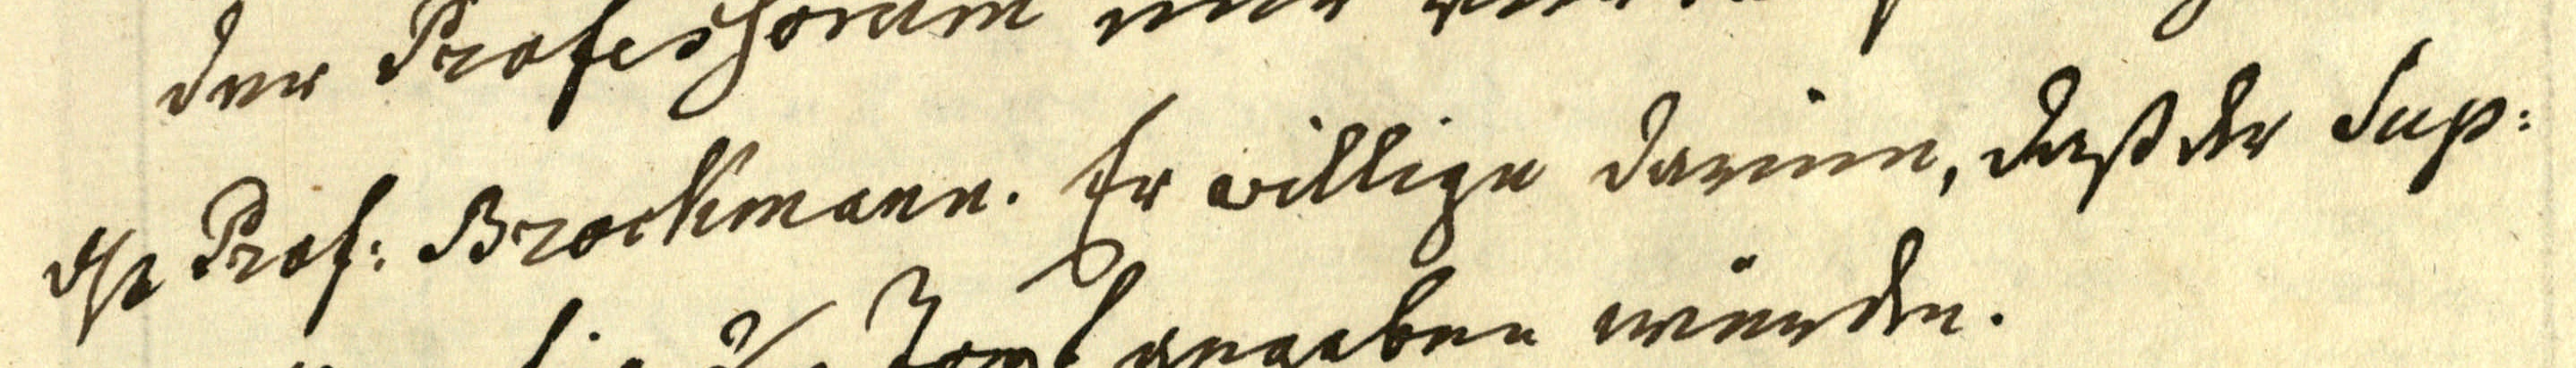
dh Prof. Brockmann. Er willige darin, daß der Sup¬
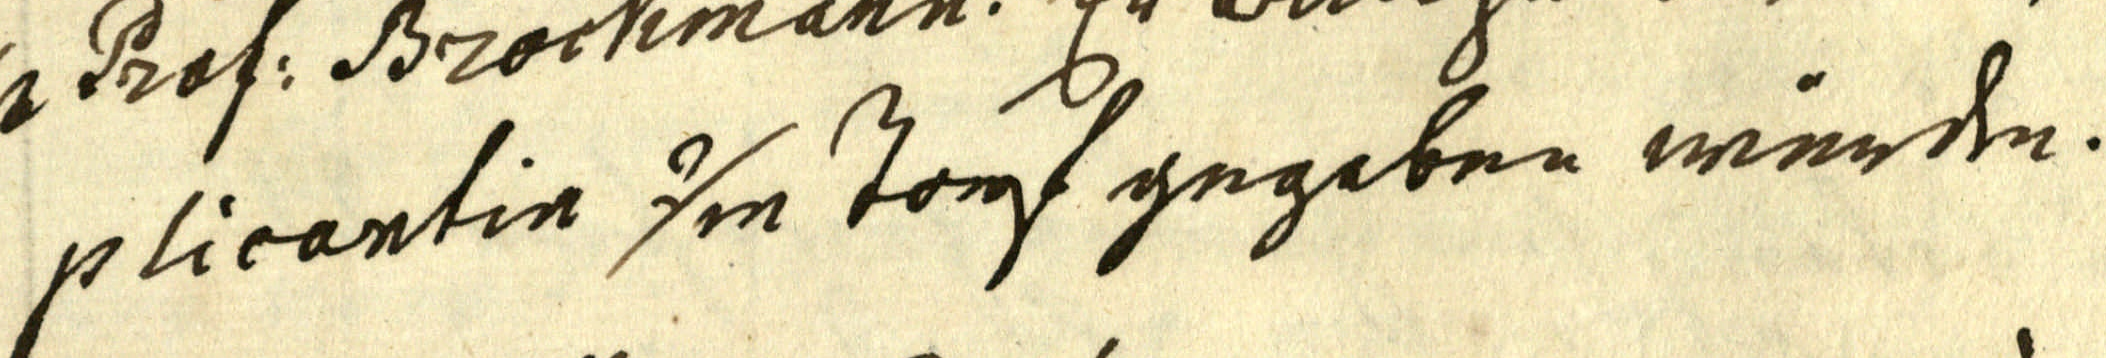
plicantin 2/m Torf gegeben würden.
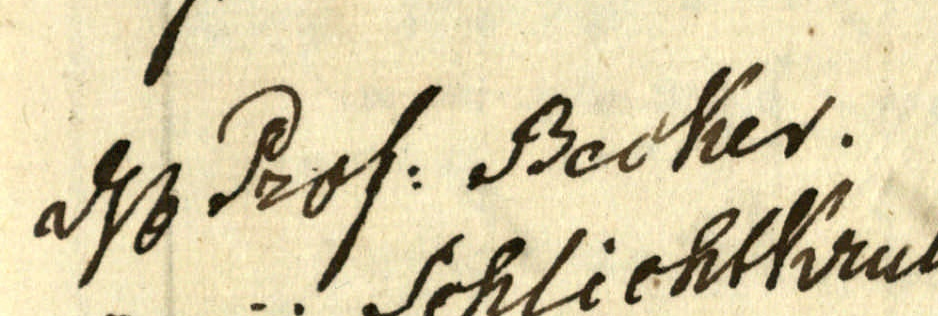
dh Prof. Becker.
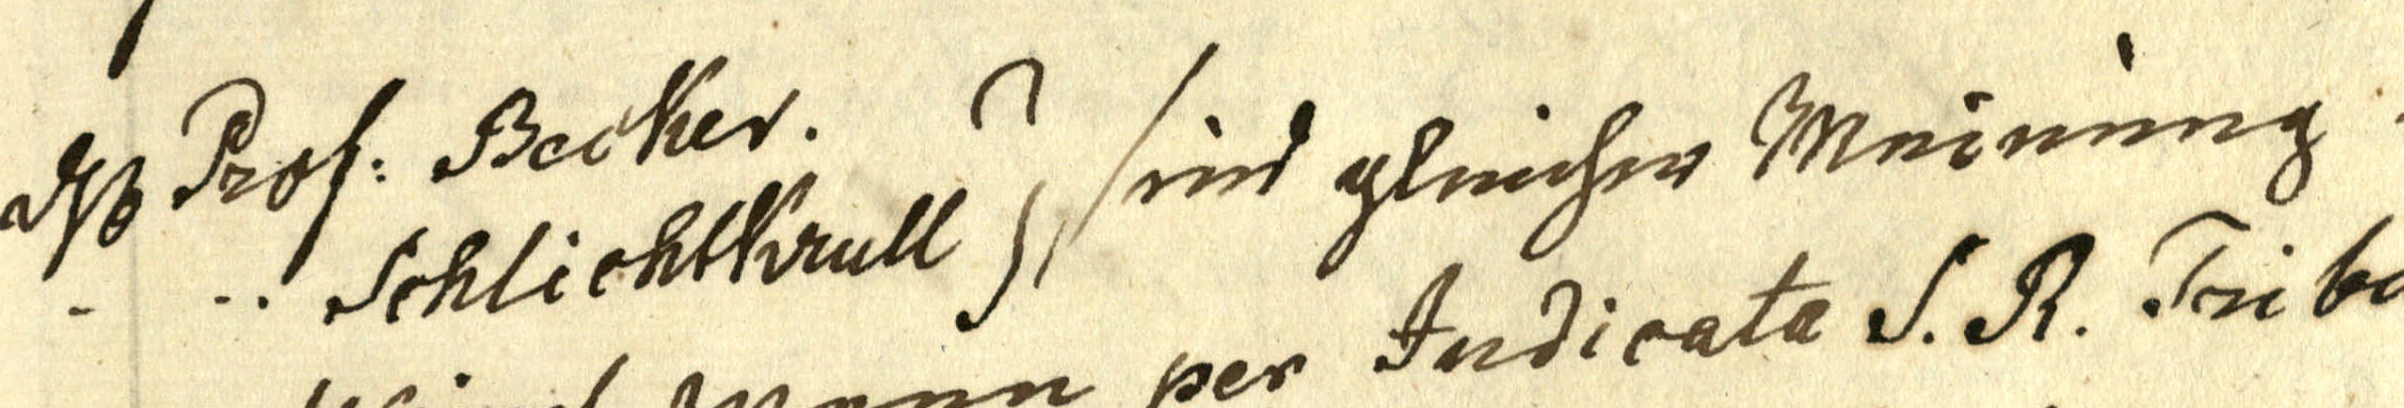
Schlichtkrull sind gleicher Meinung.
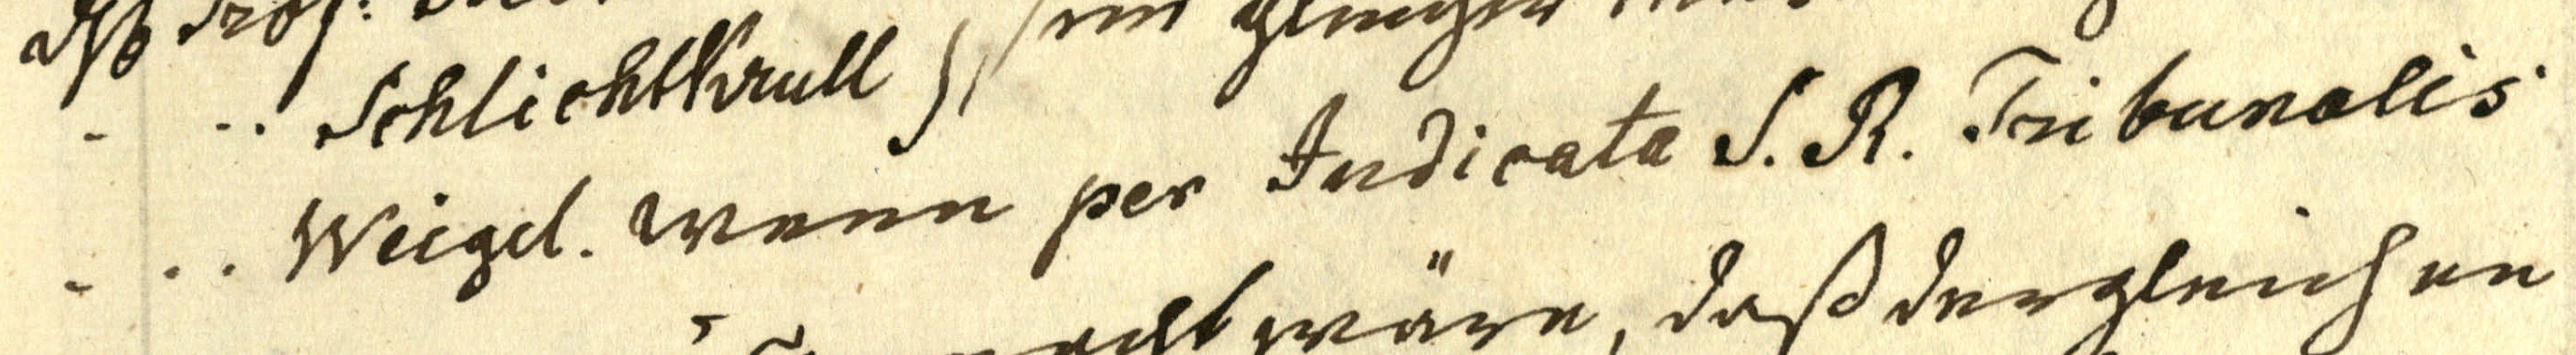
Weigel. wenn per Judicata S. R. Tribunalis
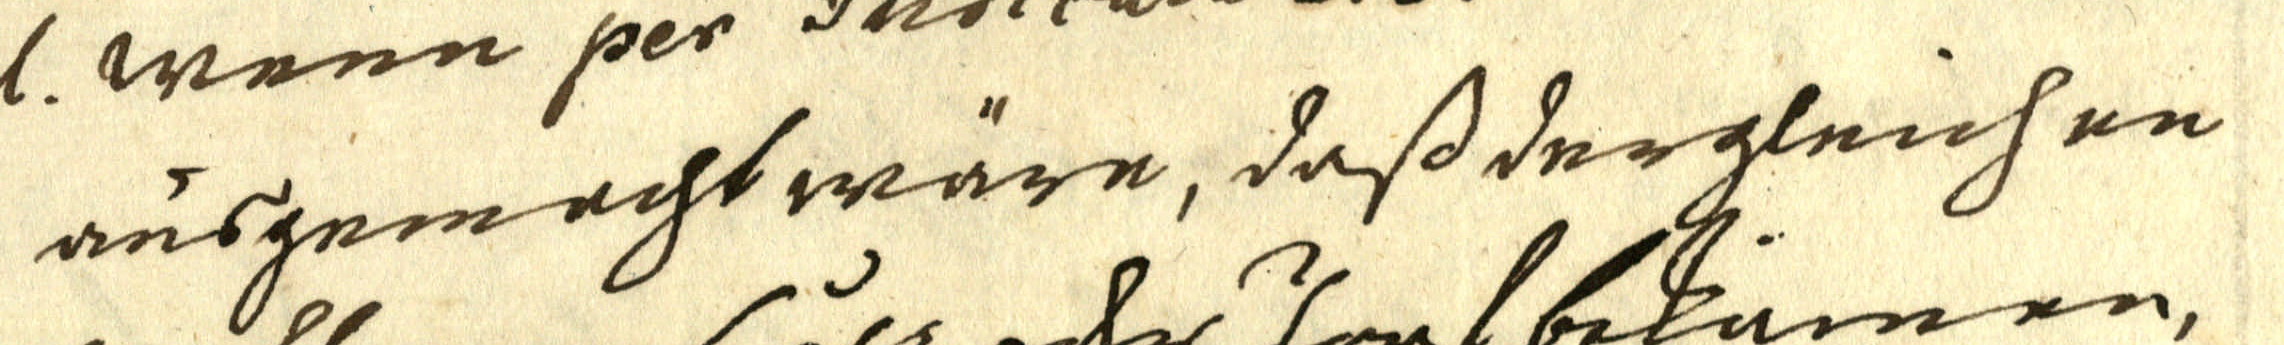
ausgemacht wäre, daß dergleichen
